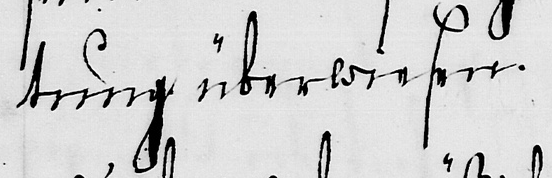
tung überwiesen.
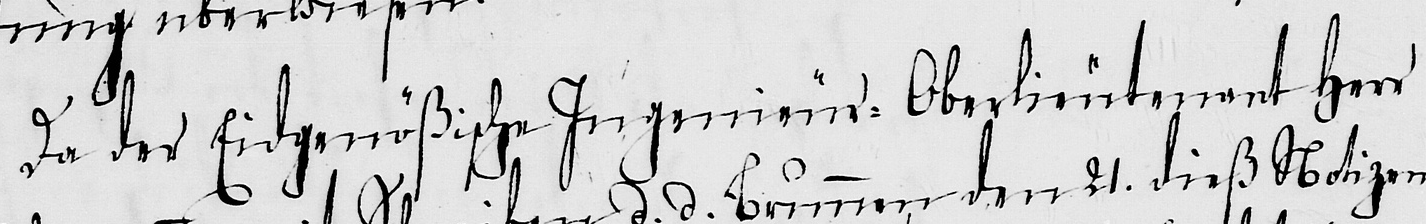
Da der Eidgenößische Ingenieur-Oberlieutenant Herr
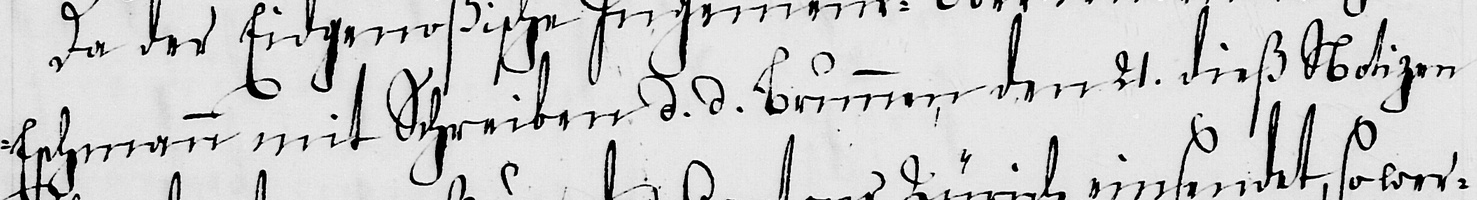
Eschmann mit Schreiben d. d. Brunnen den 21. dieß Notizen
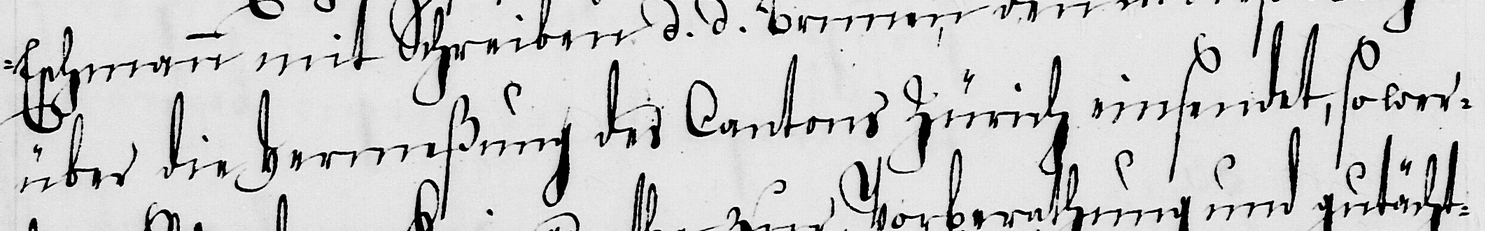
über die Vermeßung des Cantons Zürich einsendet, so wer¬
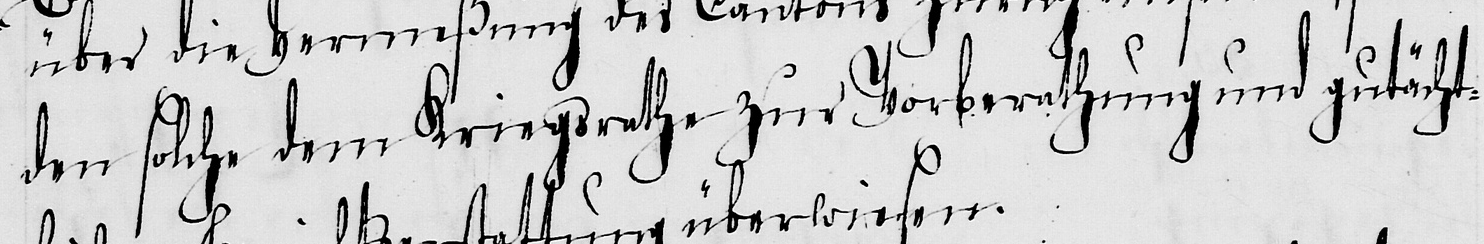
den solche dem Kriegsrathe zur Vorberathung und gutäch¬
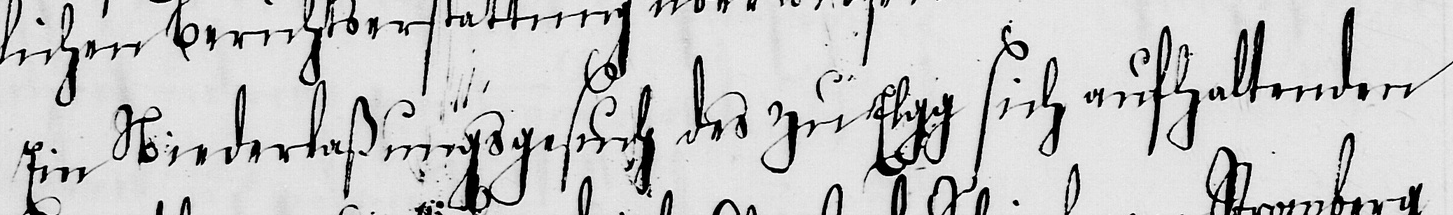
Ein Niederlaßungsgesuch des zu Elgg sich aufhaltenden
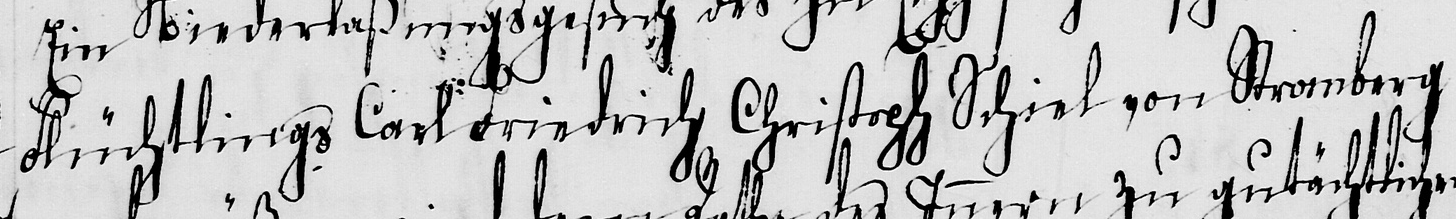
Flüchtlings Carl Friedrich Christoph Schiel von Stromberg
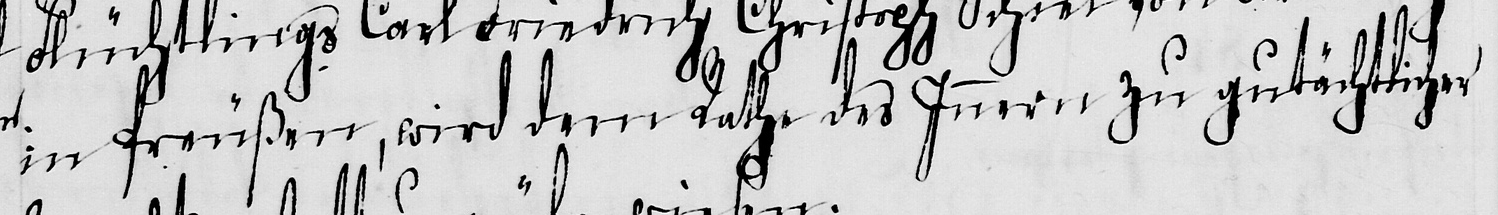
in Preußen, wird dem Rathe des Innern zu gutächtlicher
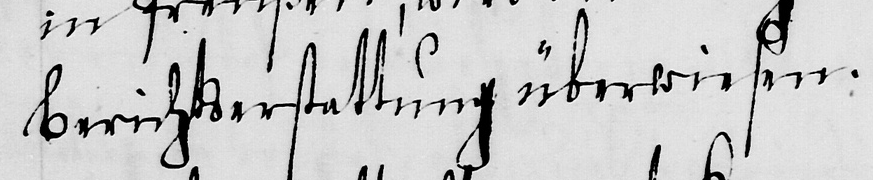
Berichterstattung überwiesen.
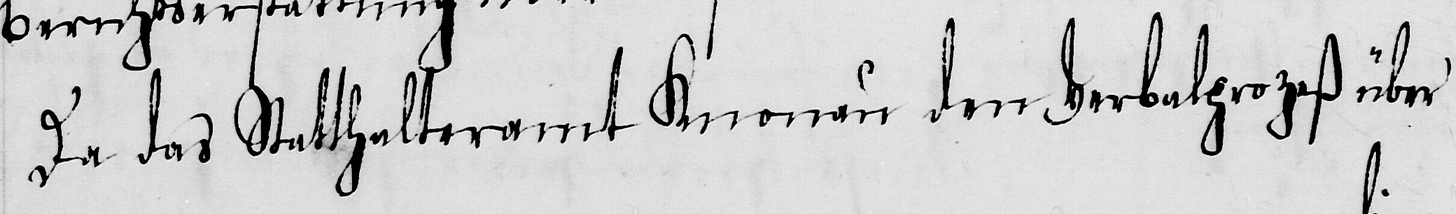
Da das Statthalteramt Knonau den Verbalprozeß über
